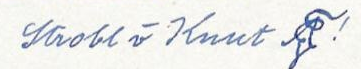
Strobl v/o Knut Cl!
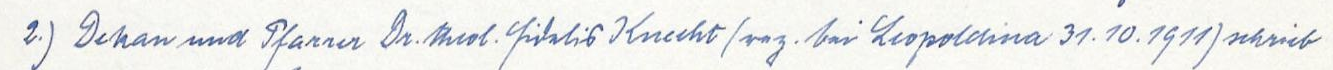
2) Dekan und Pfarrer Dr. theol Fidelis Knecht (rez. bei Leopoldina 31.10.1911) schrieb
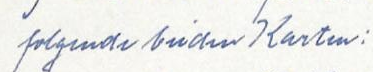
folgende beiden Karten:
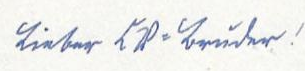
Lieber CV-Bruder!
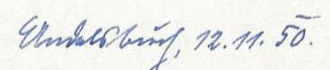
Andelsbuch, 12.11.50
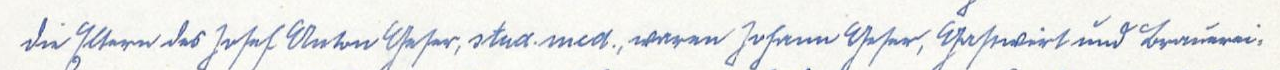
Die Eltern des Joseph Anton Geser, waren Johann Geser, Gastwirt und Brauerei-
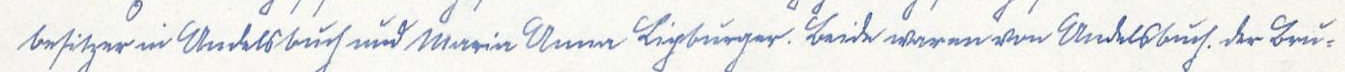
besitzer in Andelsbuch und Maria Anna Ligburger. Beide waren von Andelsbuch. Der Bru-
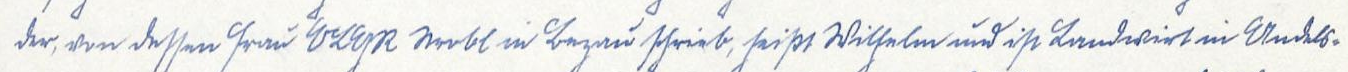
der, von dessen Frau OLGR Strobl in Bezau schrieb, heißt Wilhelm und ist Landwirt in Andels-
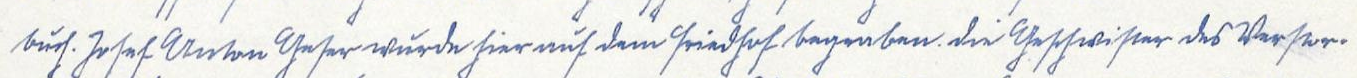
Buch. Joseph Anton Geser wurde hier auf dem Friedhof begraben. Die Geschwister des Verstor-
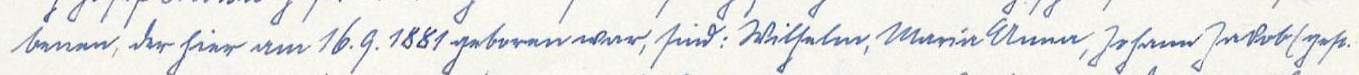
benen, der hier am 16.9.1881 geboren war, sind: Wilhelm, Maria Anna, Johann Jakob (gest.
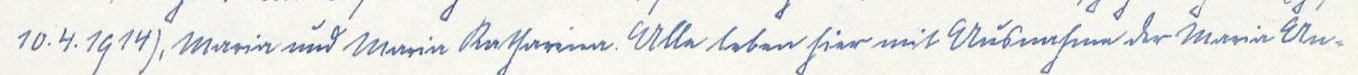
10.4.1914), Maria und Maria Katharina. Alle leben hier mit Ausnahme der Maria An
